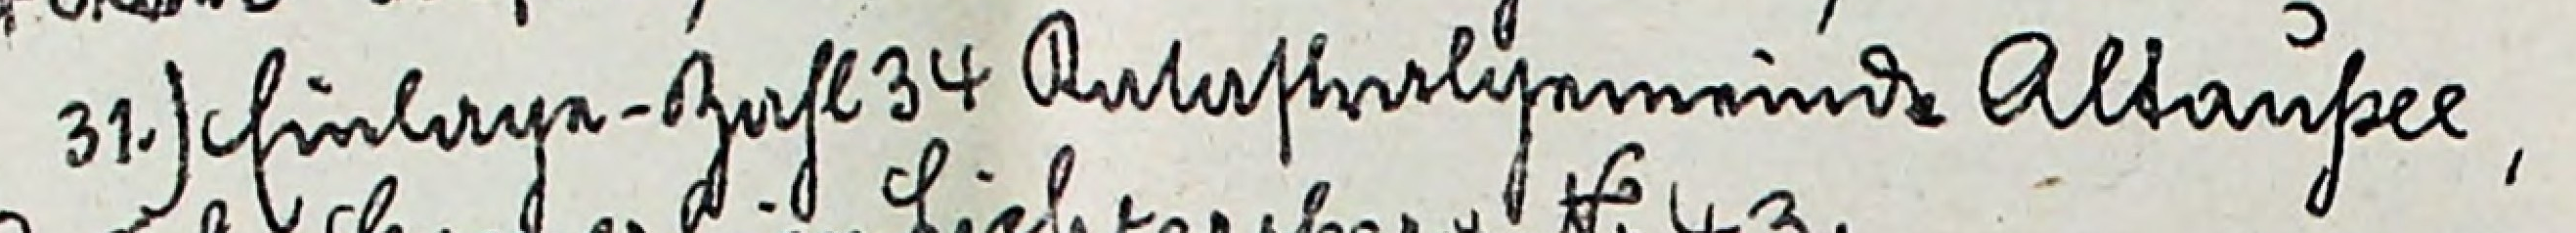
31.) Einlage - Zahl 34 Katastralgemeinde Altaussee,
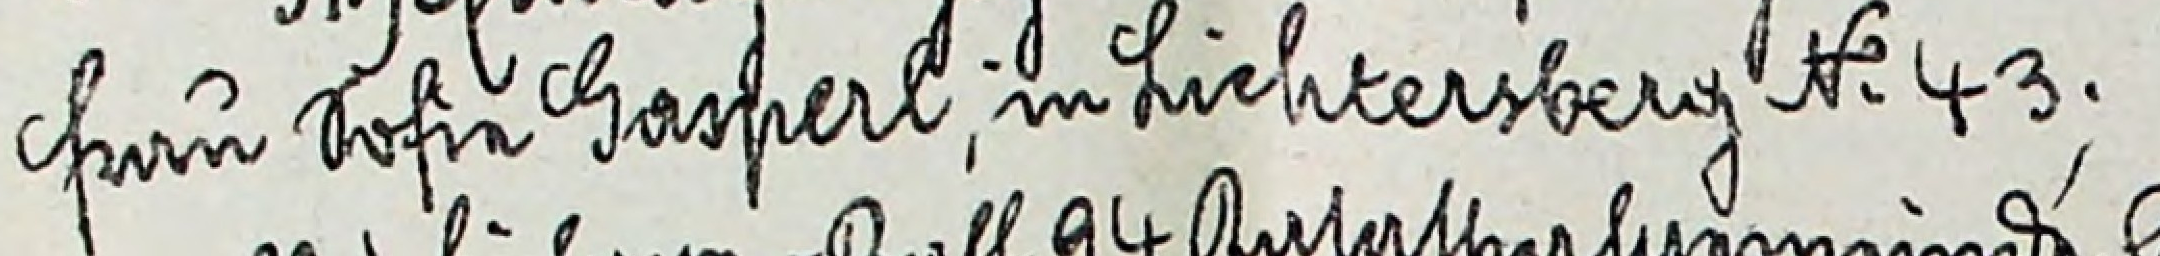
Frau Sofie Gasperl, in Lichtersberg No 43;
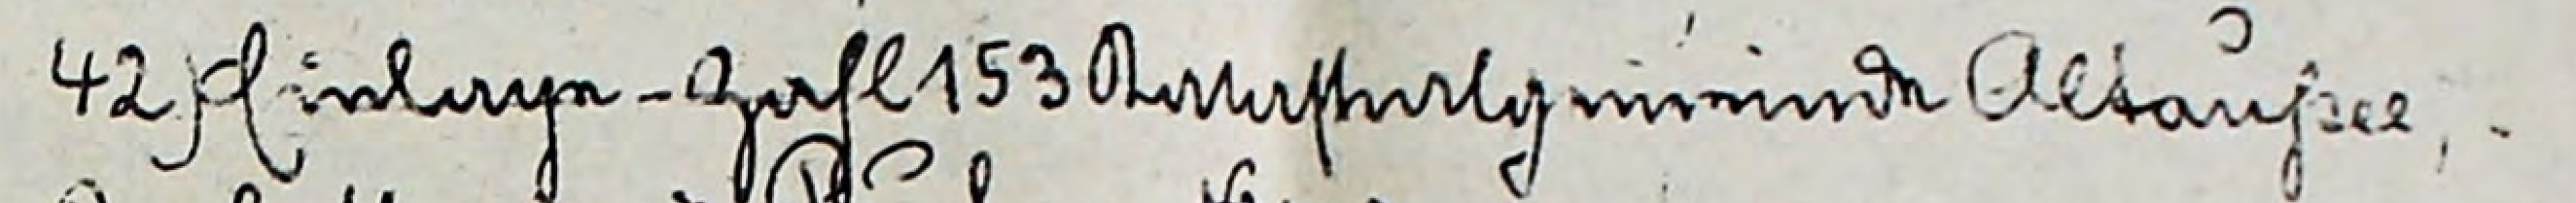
42.) Einlage - Zahl 153 Katastralgemeinde Altaussee, -
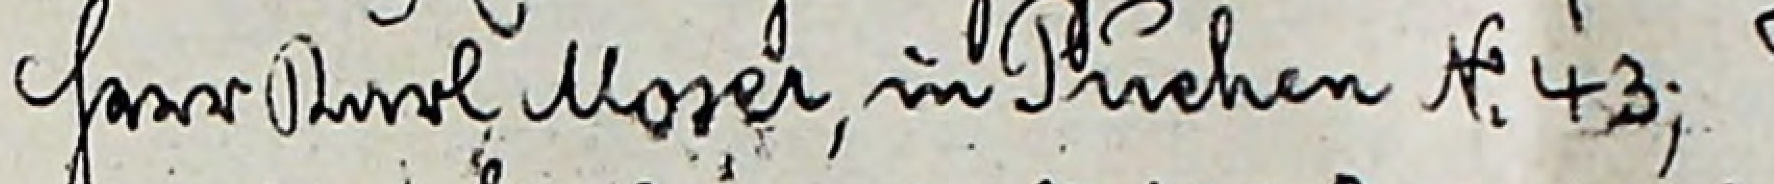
Herr Karl Moser, in Puchen No 43;
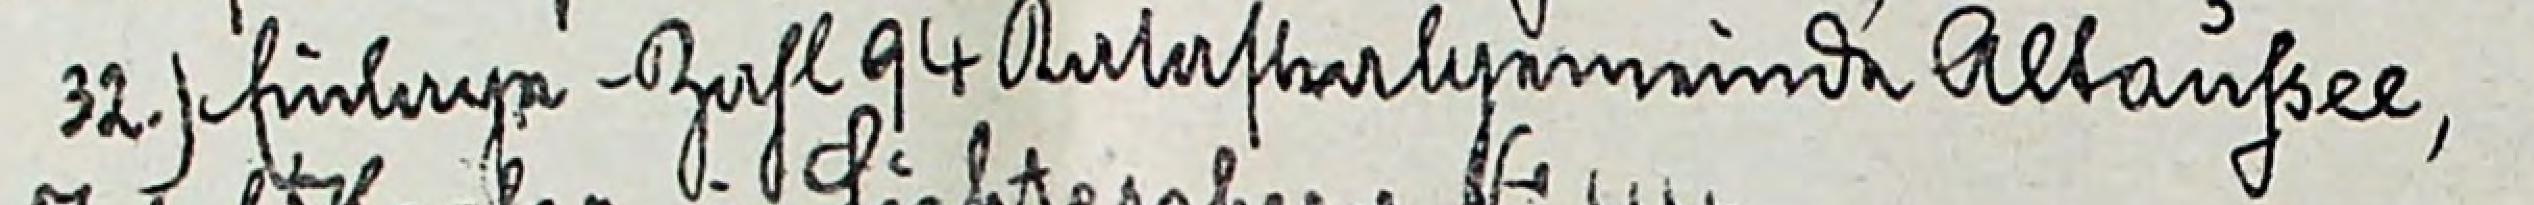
32.) Einlage - Zahl 94 Katastralgemeinde Altaussee,
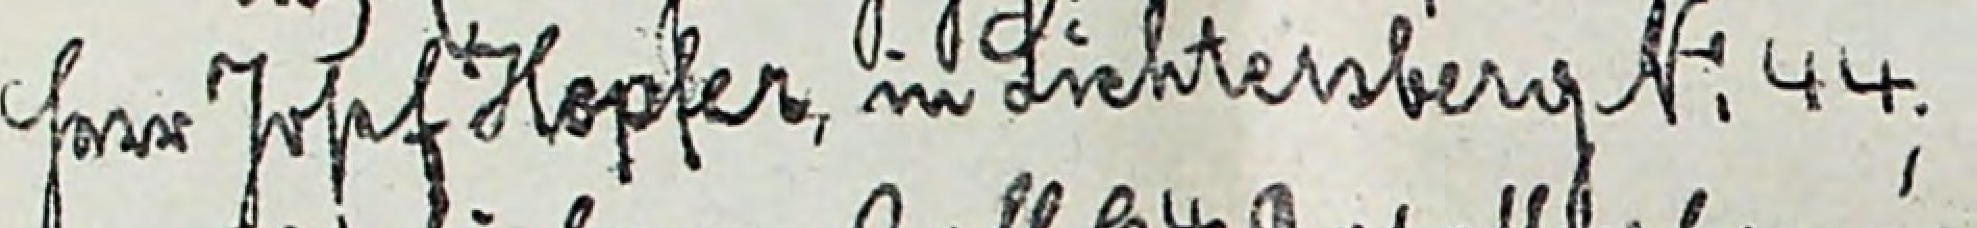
Herr Josef Hopfer, in Lichtersberg No 44;
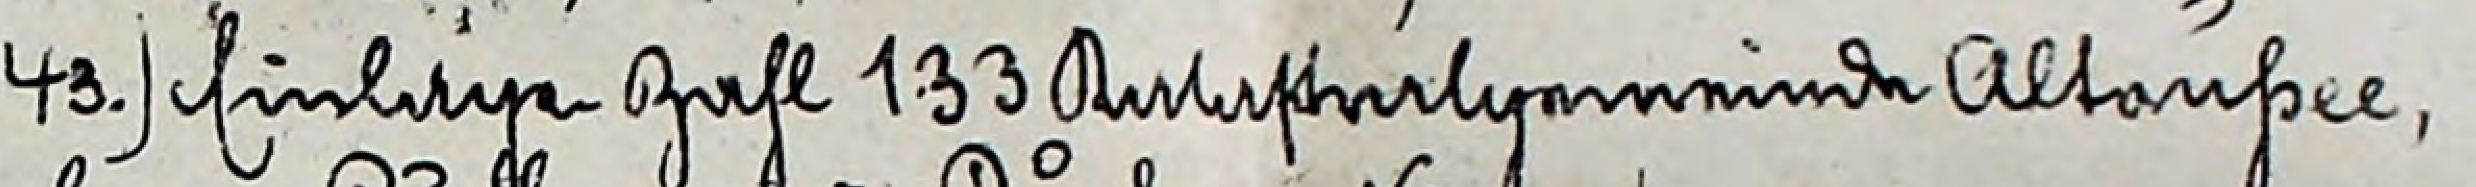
43.) Einlage - Zahl 133 Katastralgemeinde Altaussee,
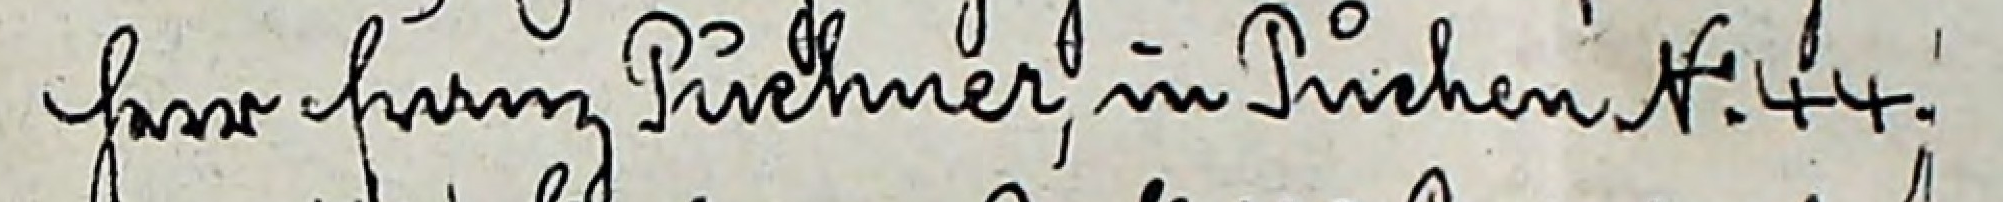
Herr Franz Puchner, in Puchen No 44;
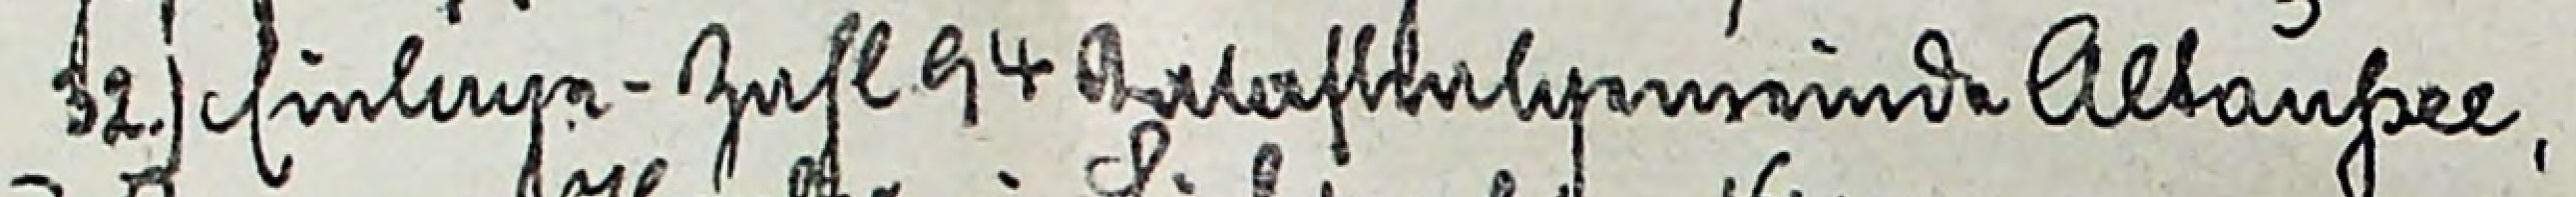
32.) Einlage - Zahl 94 Katastralgemeinde Altaussee,
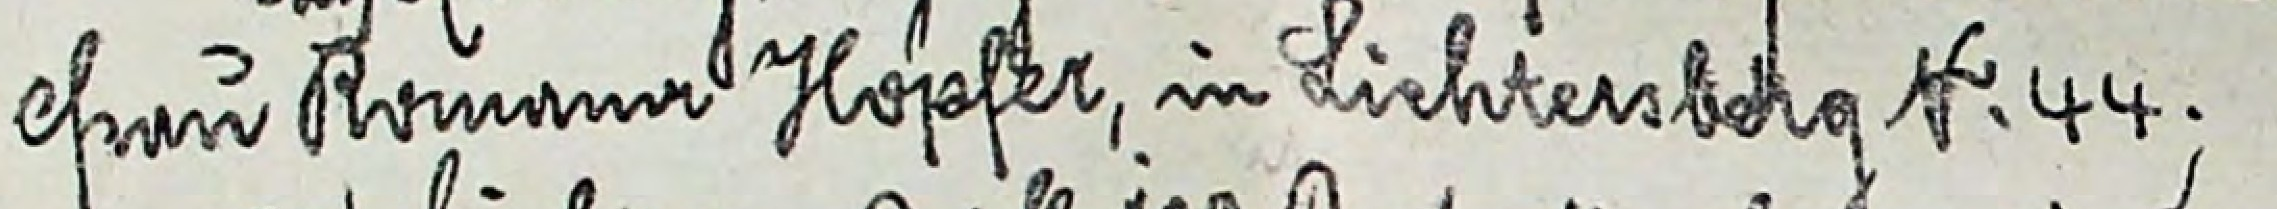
Frau Romana Hopfer, in Lichtersberg No 44;
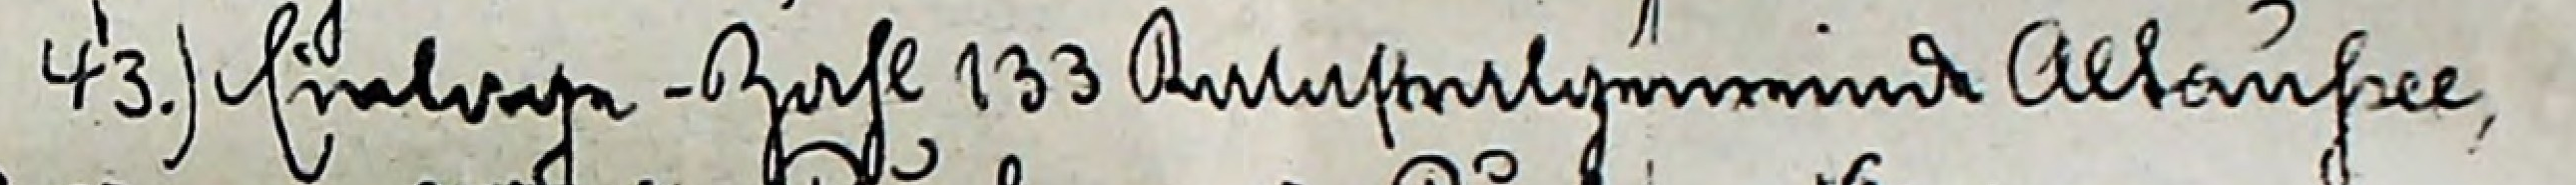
43.) Einlage - Zahl 133 Katastralgemeinde Altaussee,
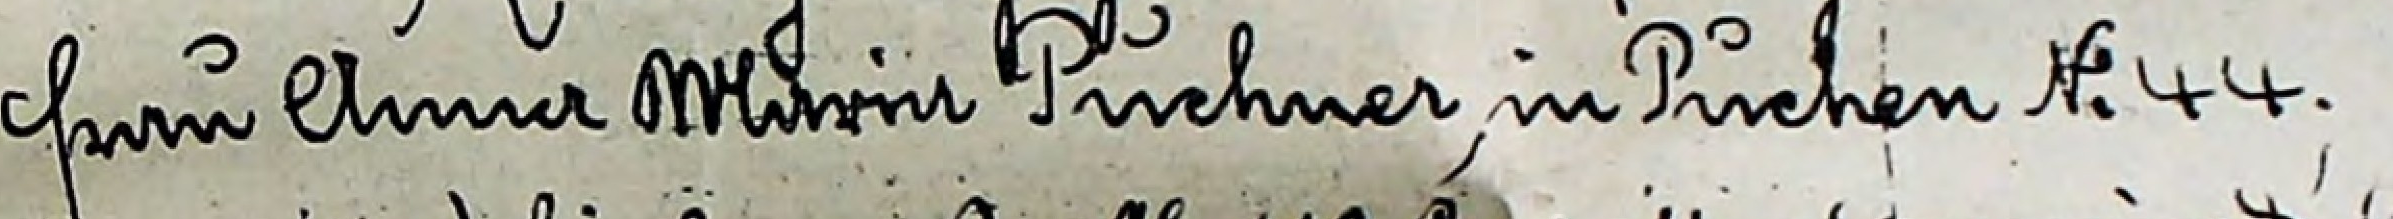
Frau Anna Maria Puchner, in Puchen No 44;
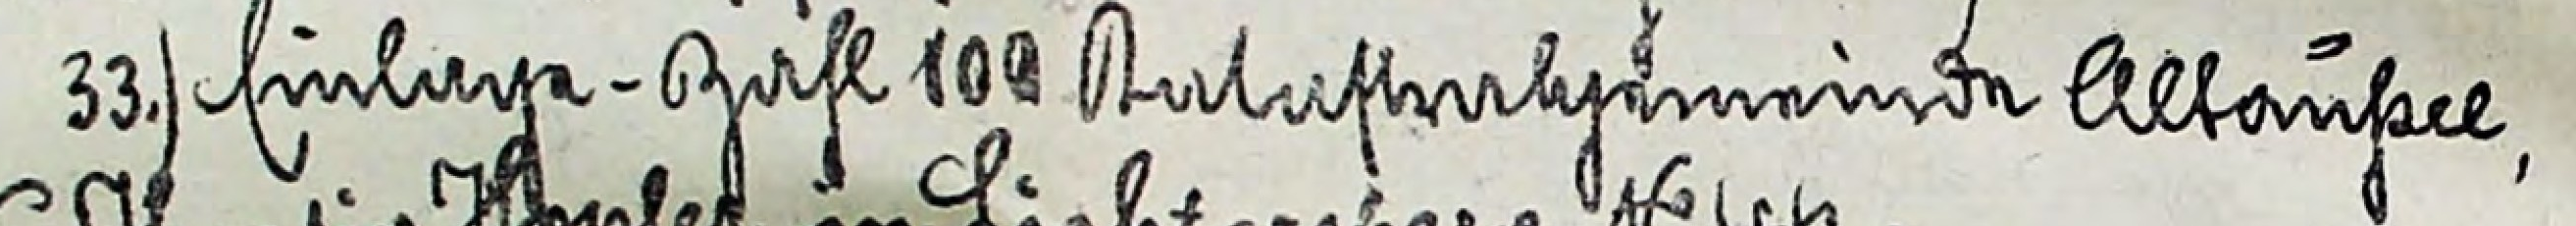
33.) Einlage - Zahl 100 Katastralgemeinde Altaussee,
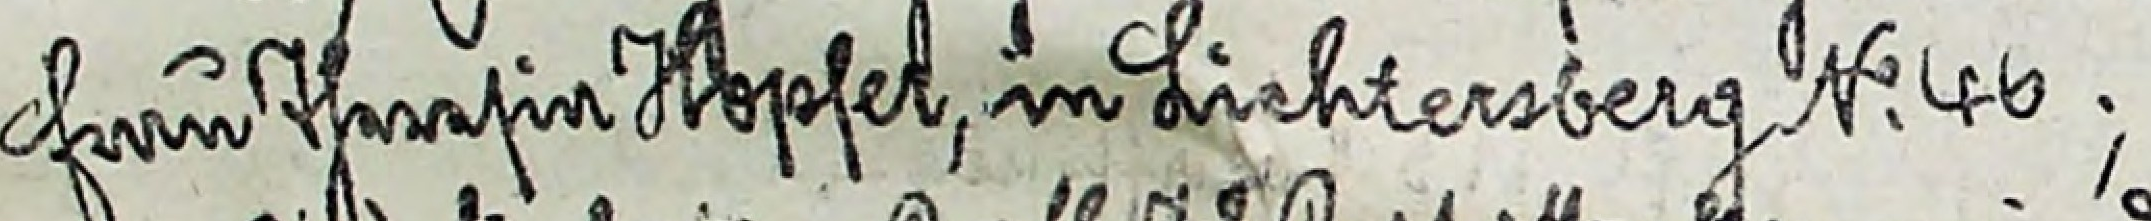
Frau Theresia Hopfer, in Lichtersberg No 46;
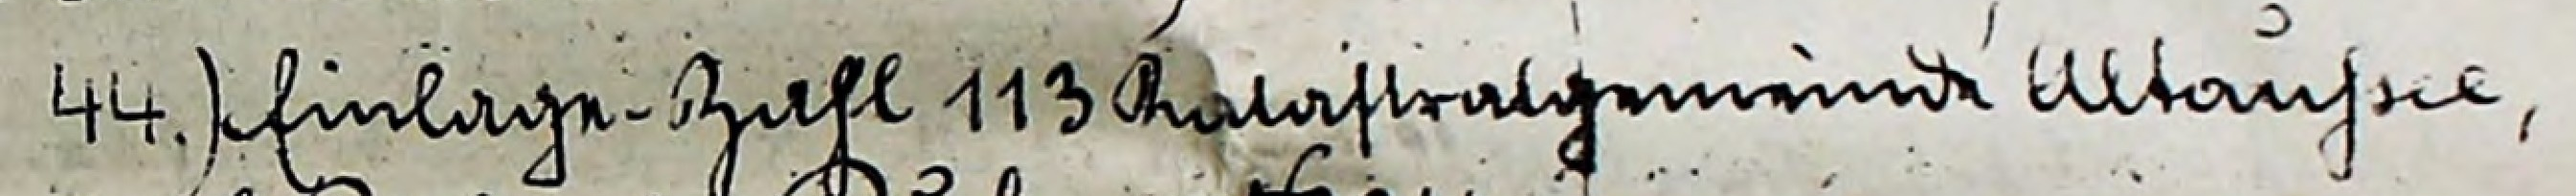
44.) Einlage - Zahl 113 Katastralgemeinde Altaussee,
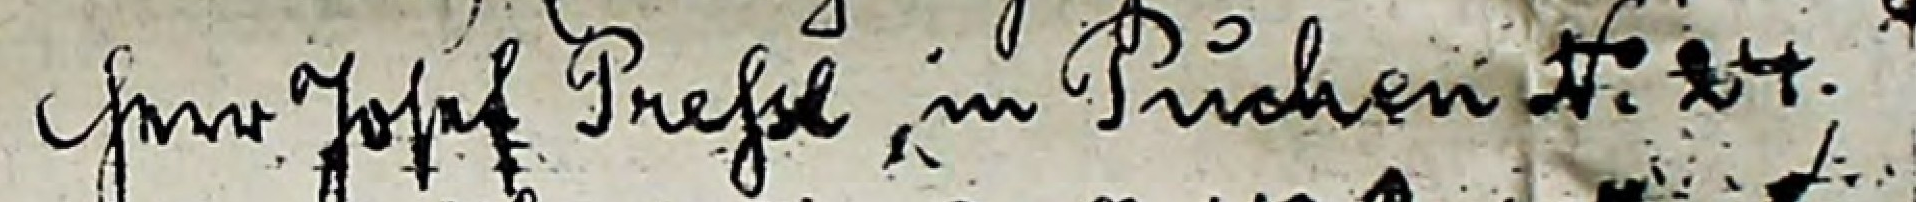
Herr Josef Pressl, in Puchen No 24;
